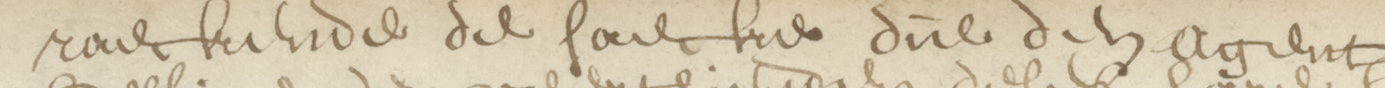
raeckende de saecke die den Agent
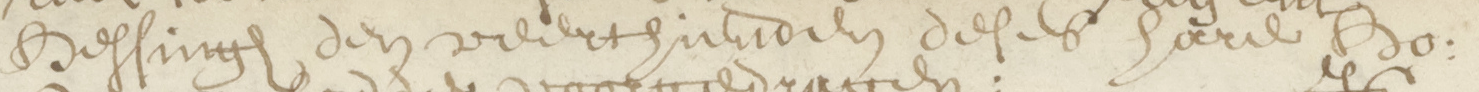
Hessingh den veerthienden deses hare Ho:
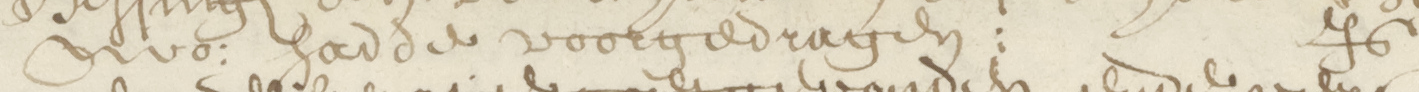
Mo: hadde voorgedragen: Is
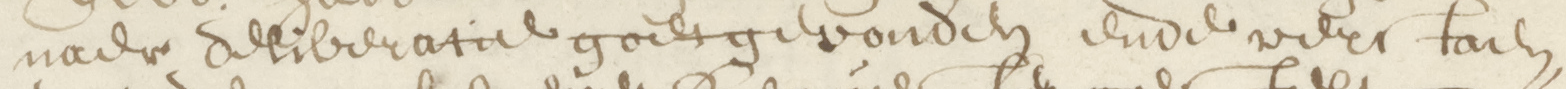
naer deliberatie goetgevonden ende verstaen,
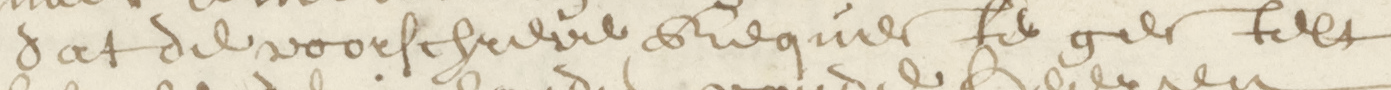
dat de voorschreve Requeste gestelt
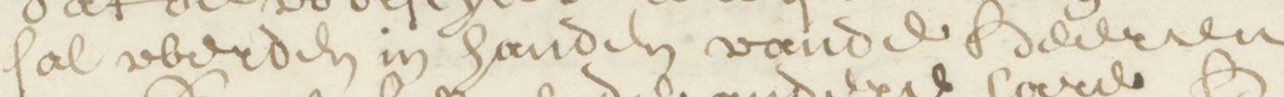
sal werden in handen vande Heeren
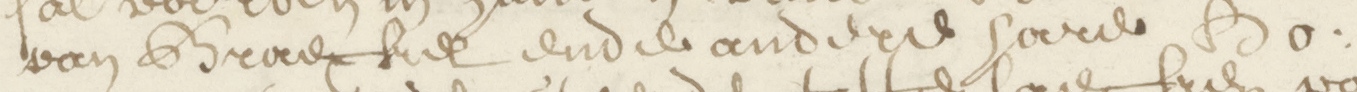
van Braeckel ende andere hare Ho:
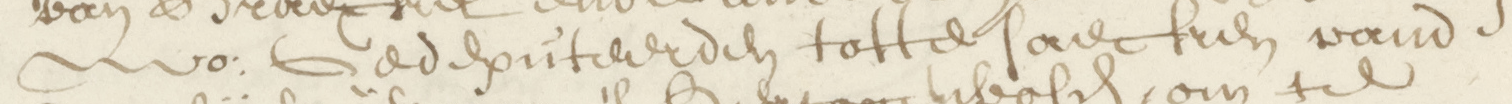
Mo: Gedeputeerden totte saecken vande
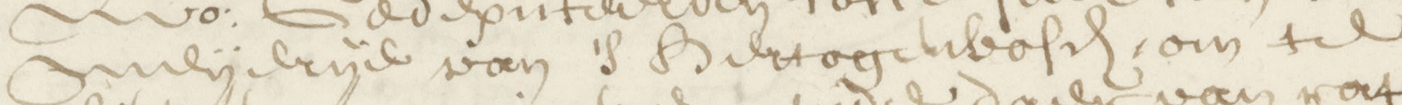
Meijerije van ‛s Hertogenbosch, om te
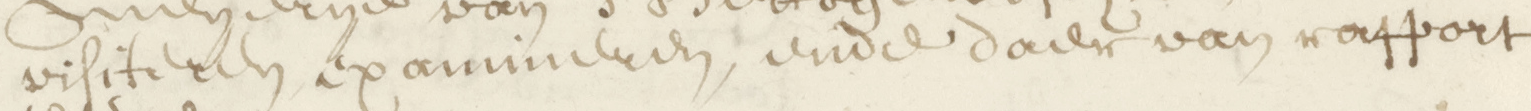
visiteren, examineren, ende daer van rapport
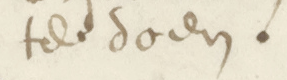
te doen.
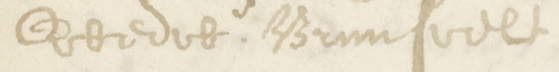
weduwe. Bruinsvelt
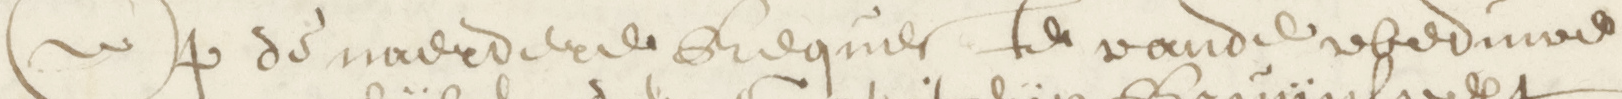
Op de naerdere Requeste vande weduwe
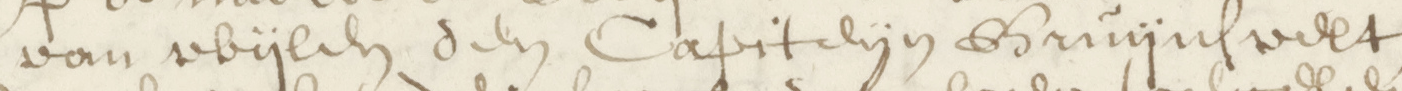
van wijlen den Capiteijn Bruijnsvelt
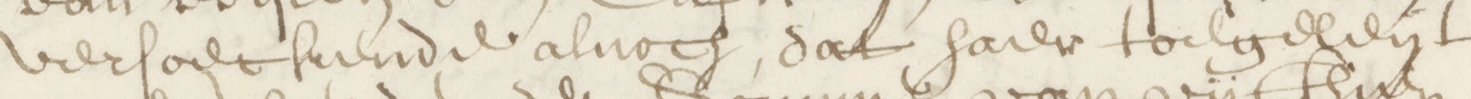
versoeckende alnoch, dat haer toegeleijt
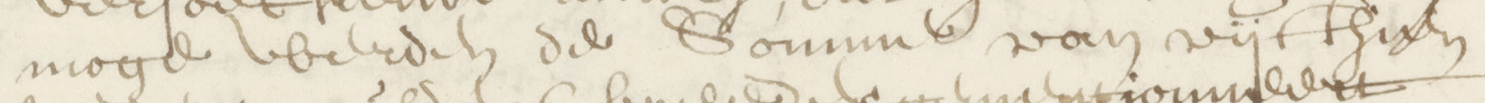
moge werden de somme van vijfthien
